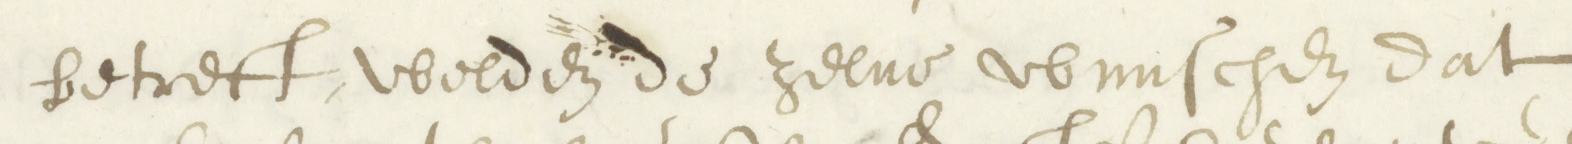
betreft, wolden de zelue wunschen dat
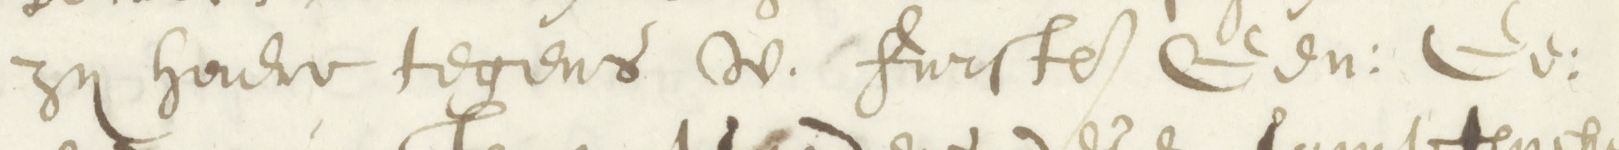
zy haere tegens U. furstel Gen: Ge:
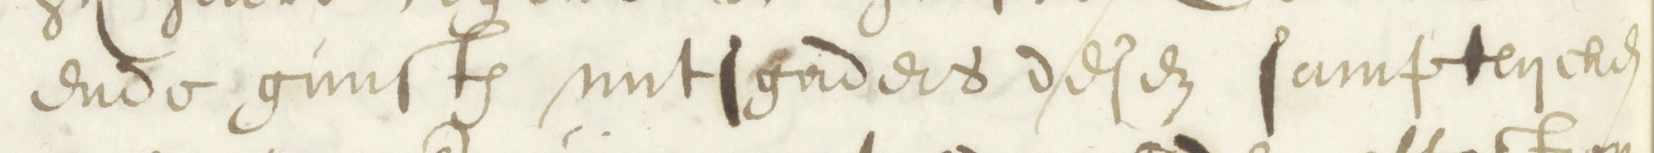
ende gunsten mitsgaders desen samptlycken
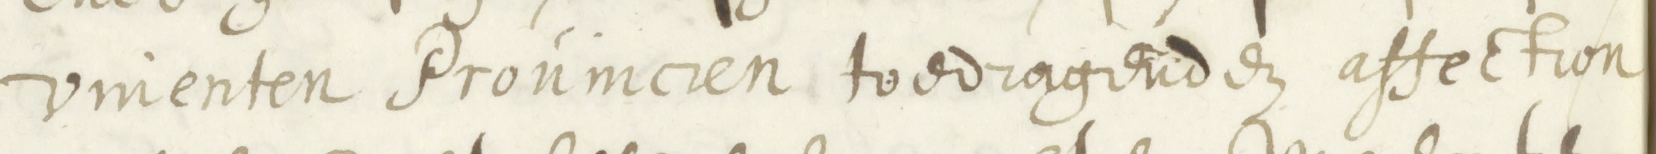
vrienten Prouincien, toedragenden affectien
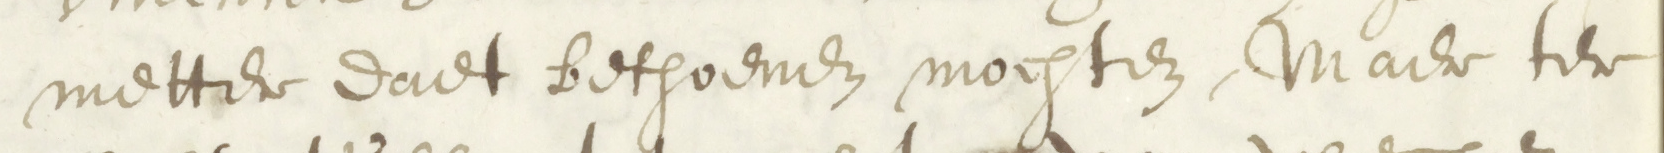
metter daet bethoenen mochten, maer ter
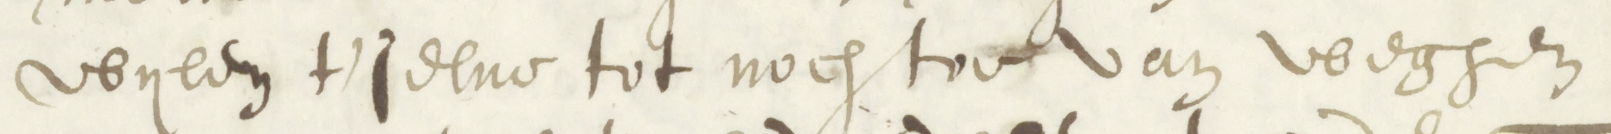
wylen t‛selue tot noch toe van weghen
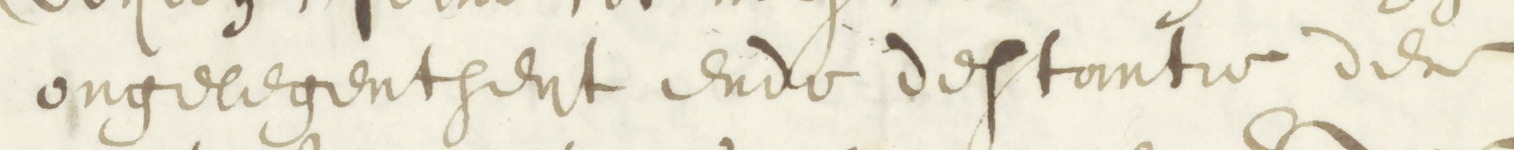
ongelegentheyt ende destantie der
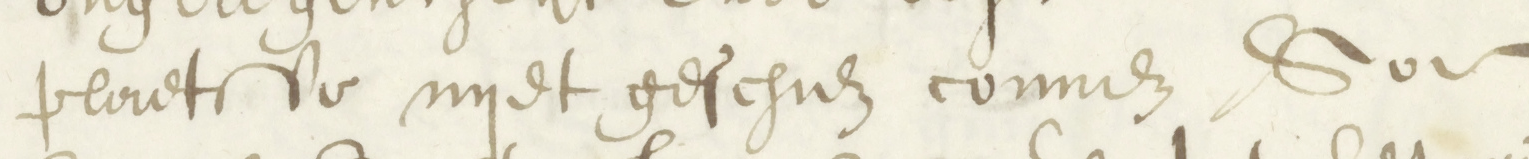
plaetsse nyet geschien connen Soe
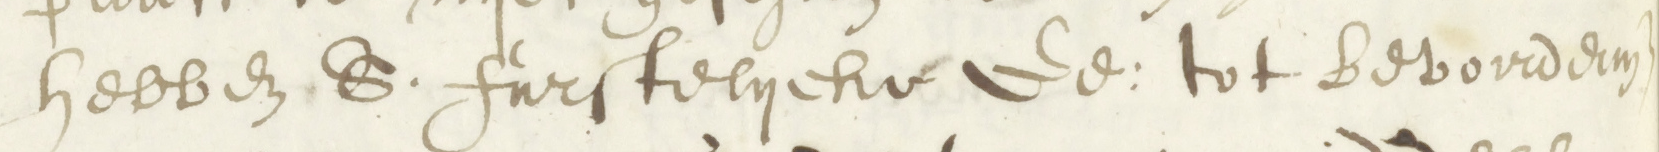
hebben S. furstelycke Ge: tot bevoirderen
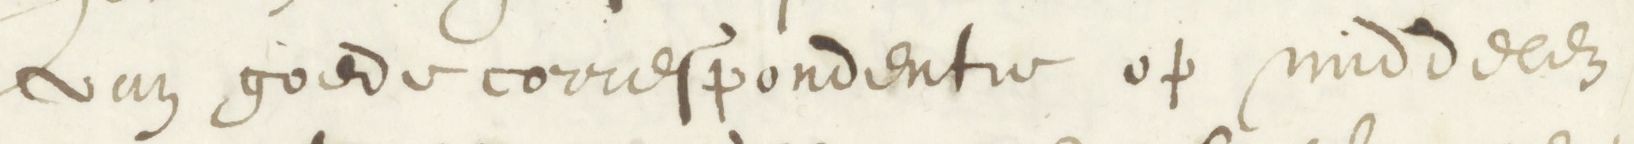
van goede correspondentie op middelen
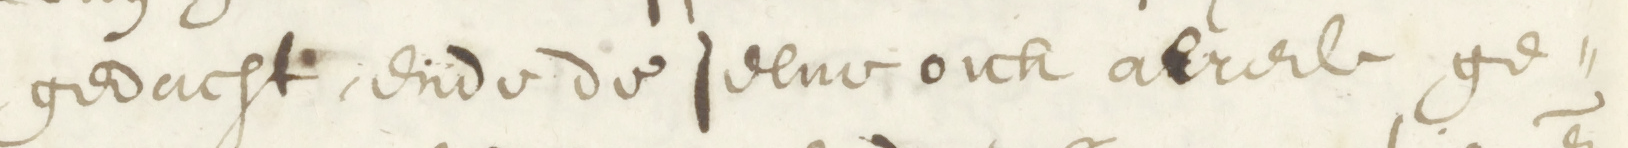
gedacht, ende de selue oick alrede ge„
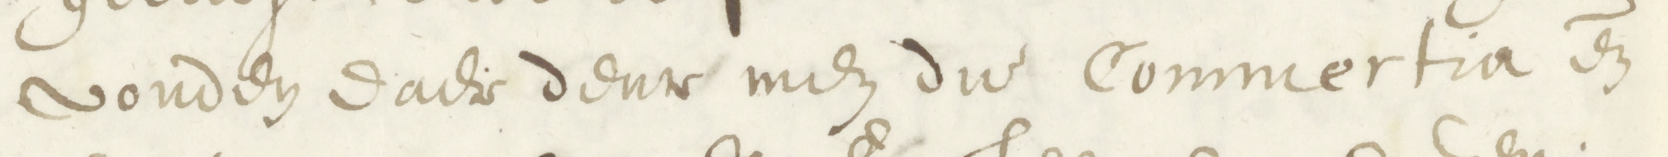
vonden daer deur men die Commertia en
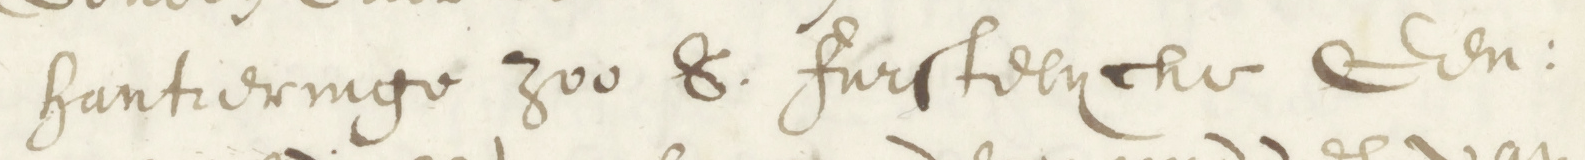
hantieringe zoo S. furstelycke Gen:
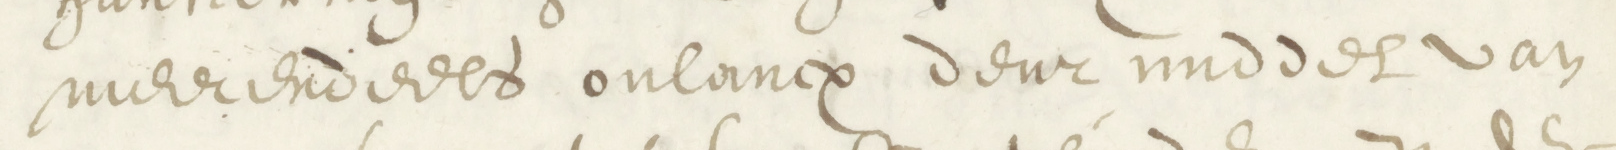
meerendeels onlancx deur middel van
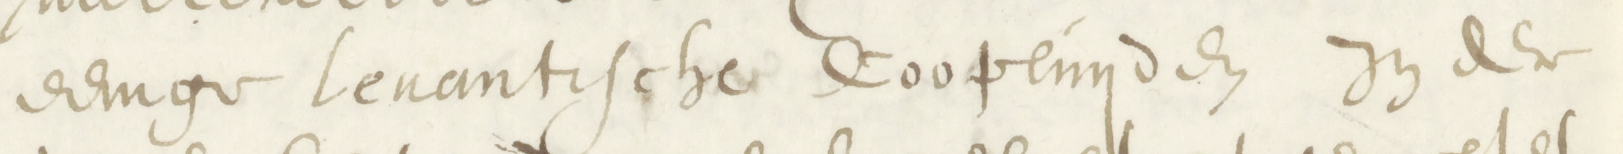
eenige Leuantische Coopluyden In der
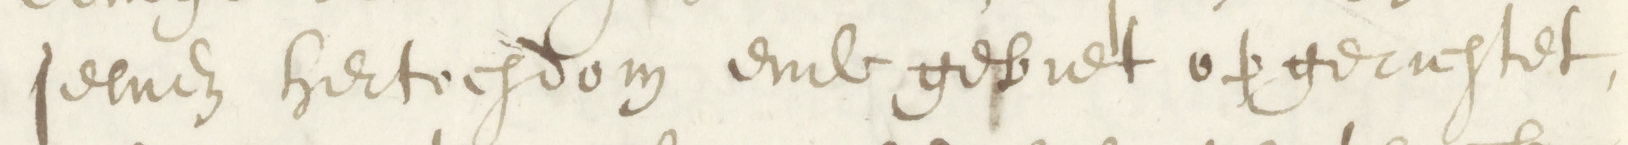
seluen hertochdom ende gebiet opgerichtet
